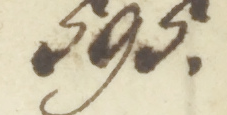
595.
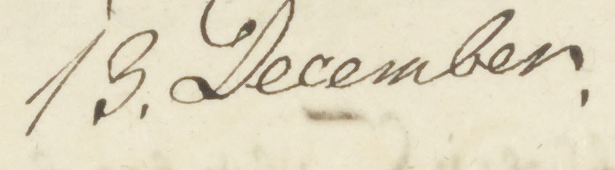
13. December.
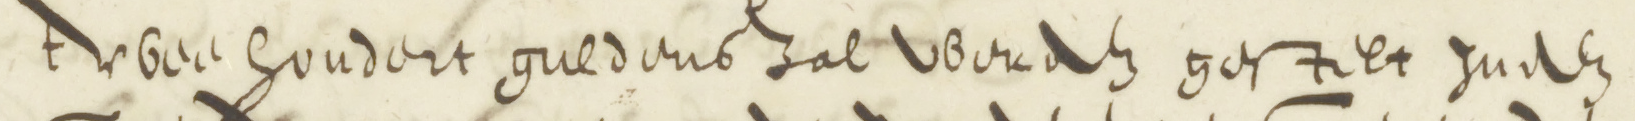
twee hondert guldens zal werden gestelt Inden
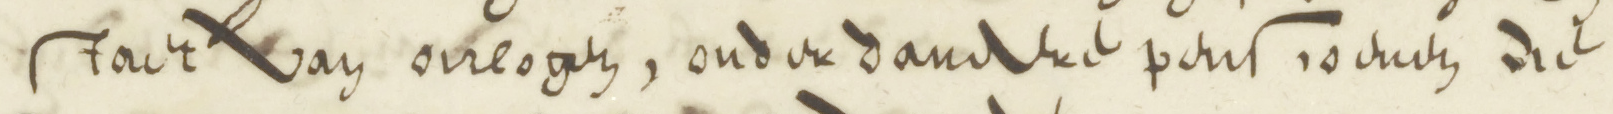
staet van oirlogen, onder dandere pensioenen die
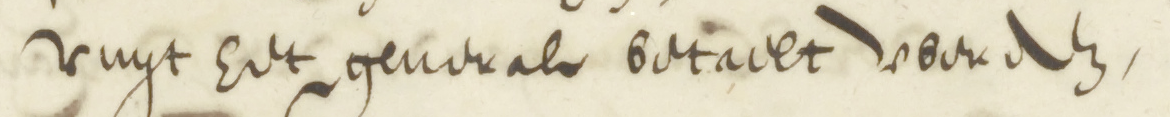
vuyt het generale betaelt werden.
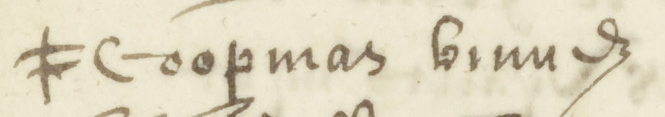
ǂ Coopman binnen.
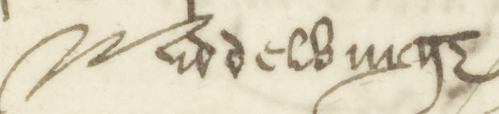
Middelburgh
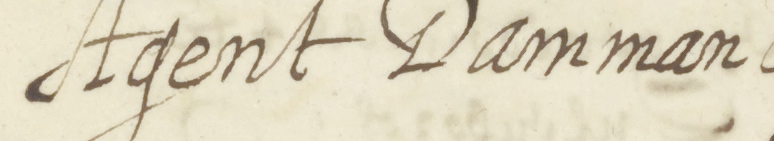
Agent Damman
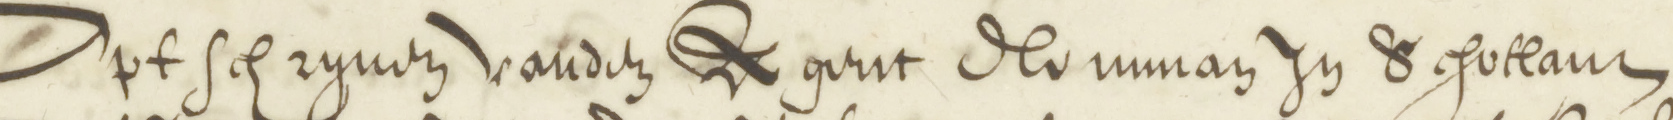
Opt schryuen vanden Agent Damman In Schotlant,
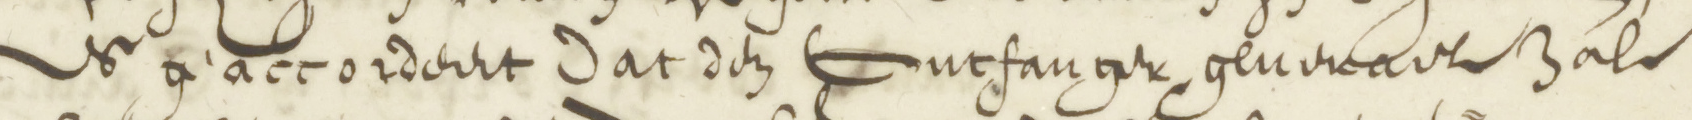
es geaccordeert dat den Ontfanger generael zal
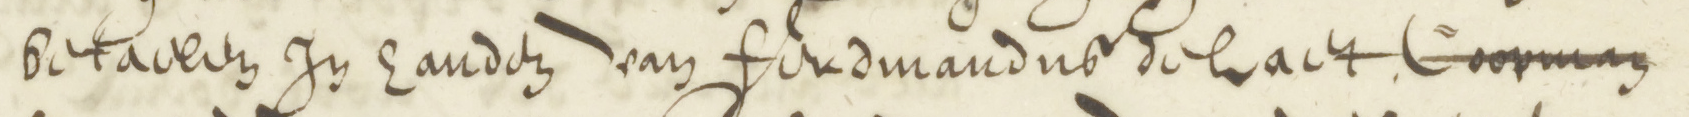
betaelen In handen van Ferdinandus de laet Coopman
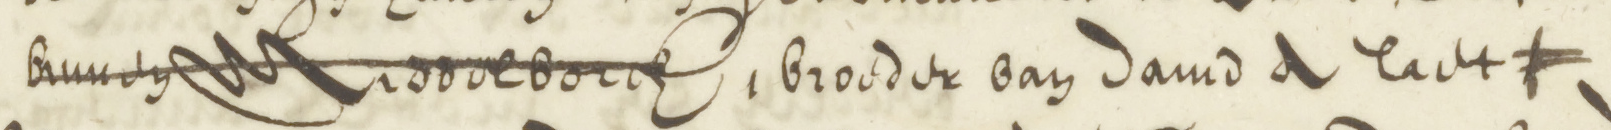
binnen Middelborch, broeder van dauid d laet ǂ
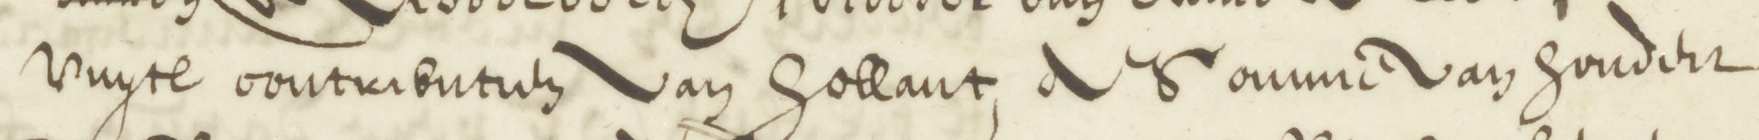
vuyte contributien van Hollant de somme van hondert
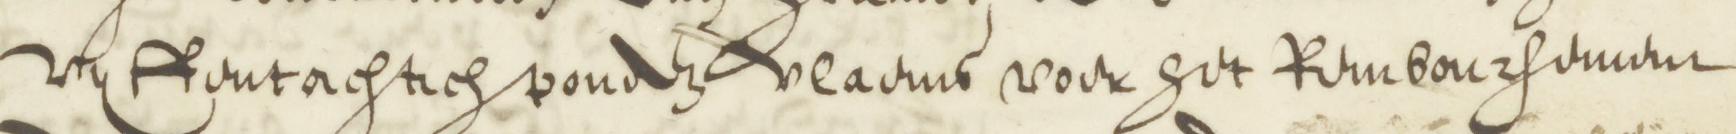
vijffentachtich ponden vlaems voer het Remboursement
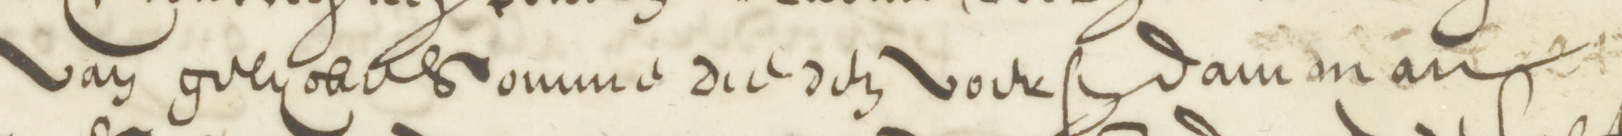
van gelycke Somme die den voerss Damman
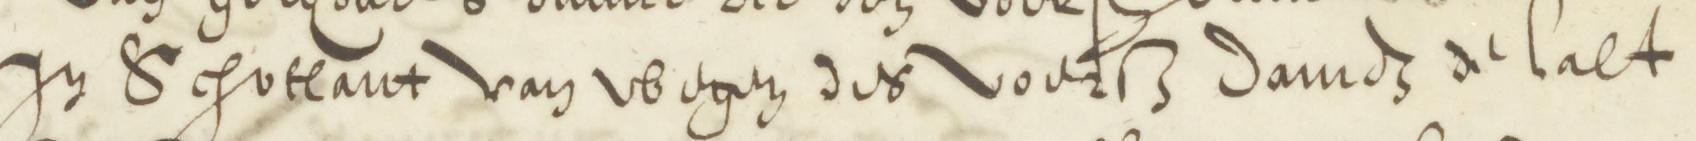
In Schotlant van wegen des voers Dauid de Laet
